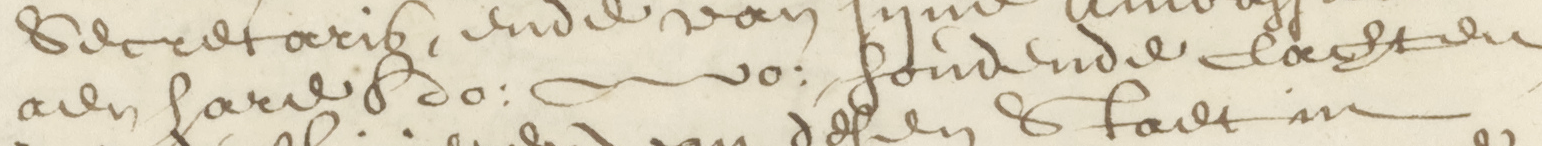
aen hare Ho:Mo: houdende clachten
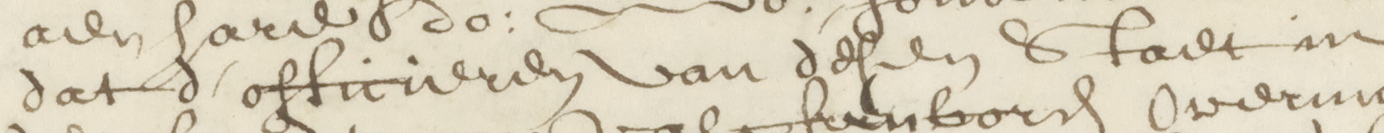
dat d'officieren van desen Staet in
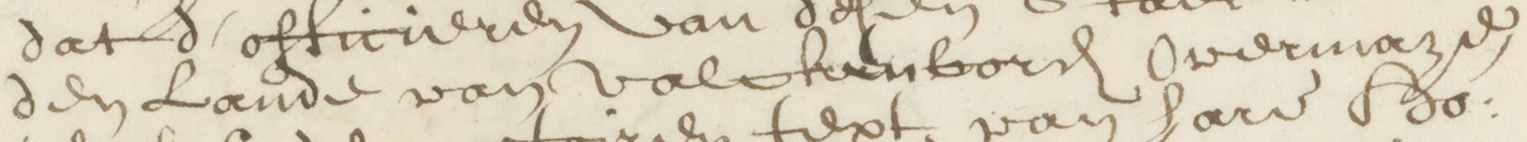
den Lande van Valckenborch Overmaze,
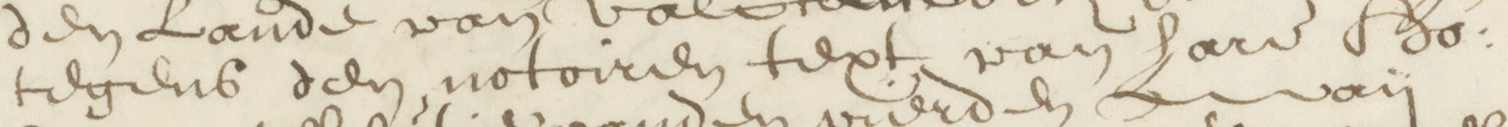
tegens den notoiren text van hare Ho:
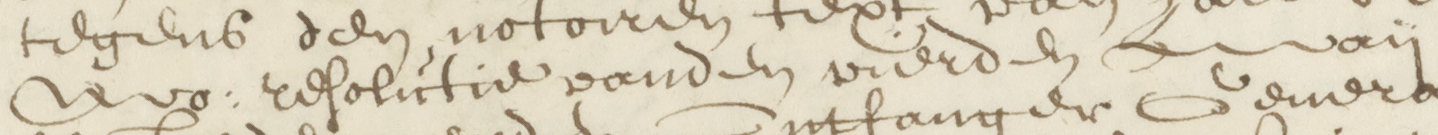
Mo: resolutie vanden vierden Maij
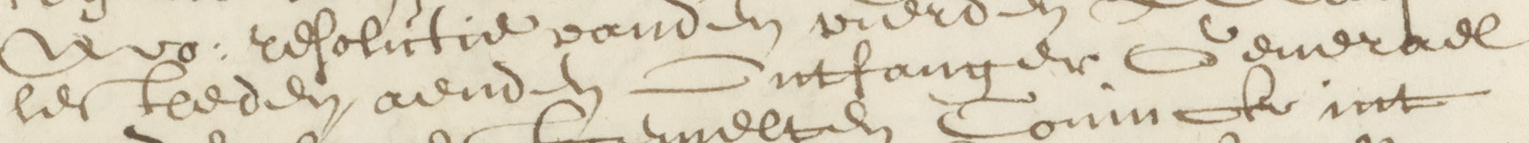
lestleeden aenden Ontfanger Generael
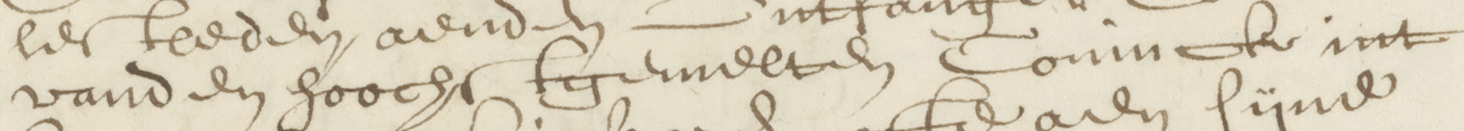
vanden Hoochstgemelten Coninck int
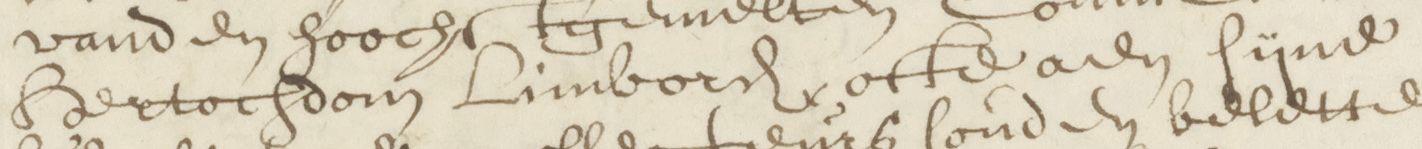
Hertochdom Limborch ofte aen sijne
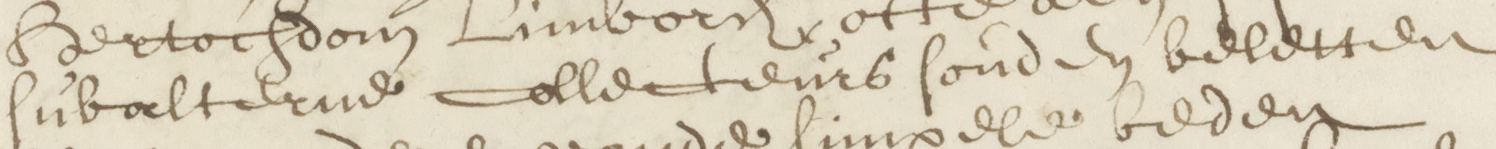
subalterne Collecteurs souden beletten
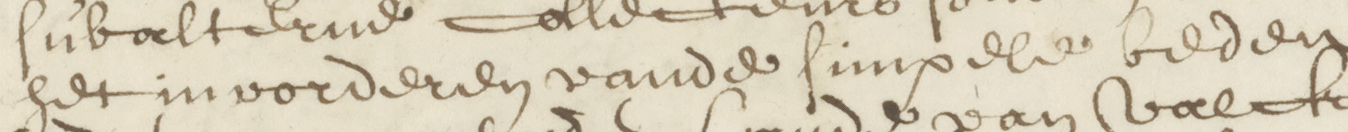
het invorderen vande simpele beden
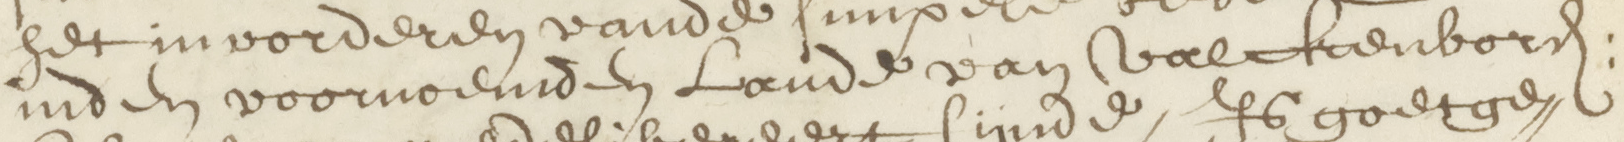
inden voornoemden Lande van Valckenborch:
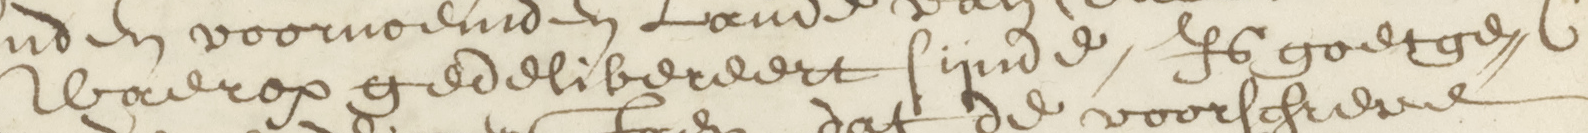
Waerop gedelibereert sijnde, Is goetge„
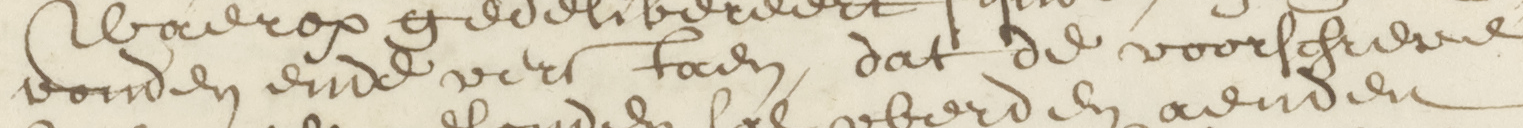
vonden ende verstaen, dat de voorschreve
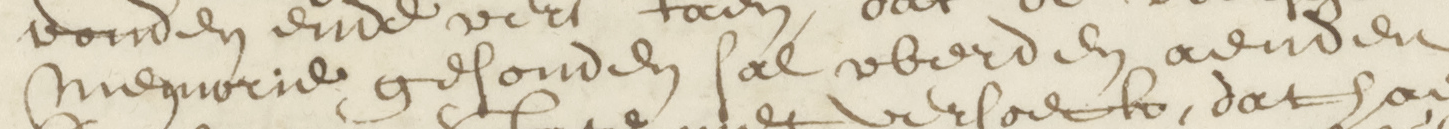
memorie gesonden sal worden aenden
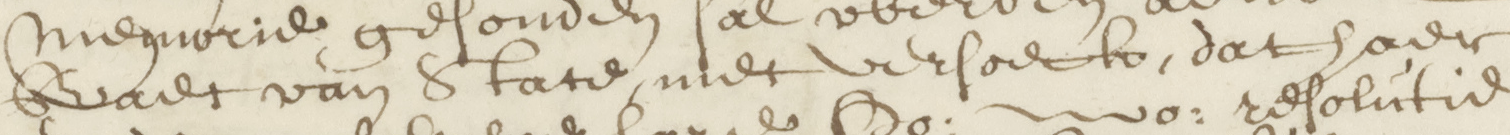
Raet van State, met versoeck, dat haer
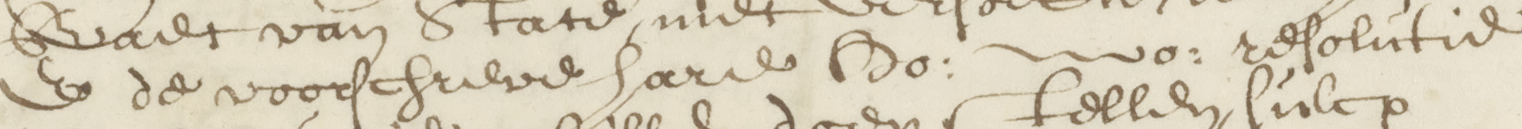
E de voorschreve hare Ho: Mo: resolutie
